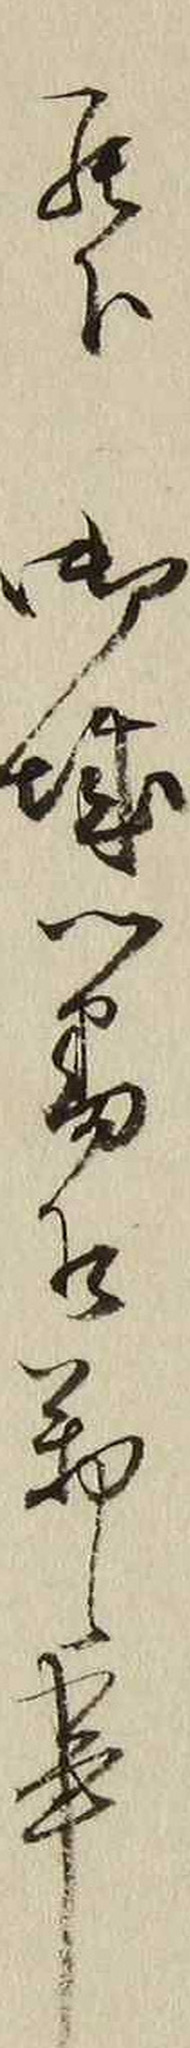罷下御城御番相勤候事
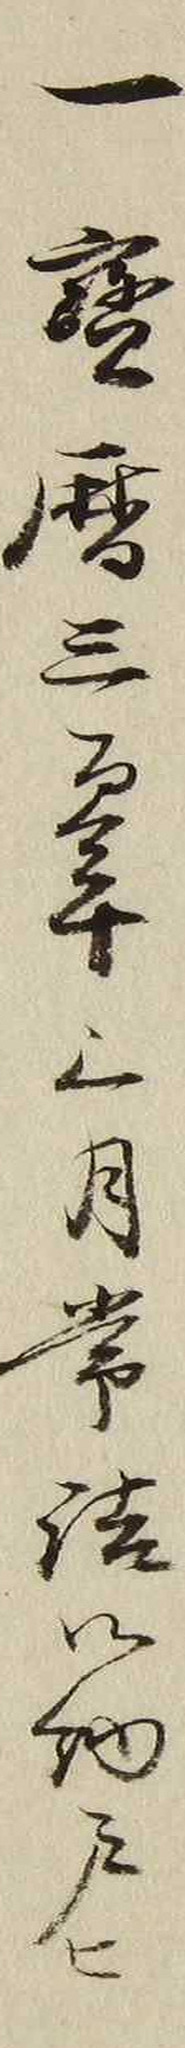一宝暦三酉年三月常詰御納戸被
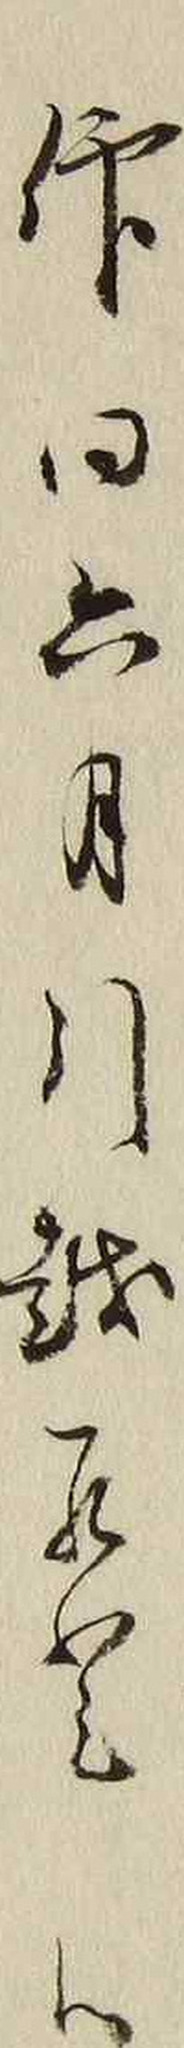仰同六月引越罷登候
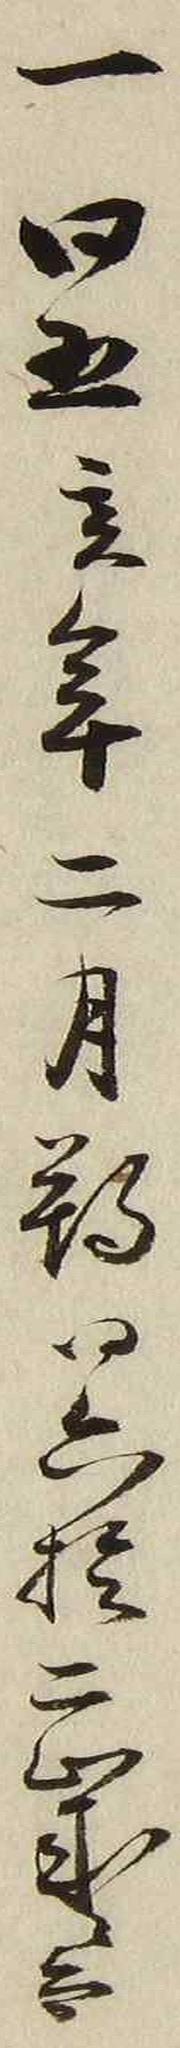一同五亥年二月朔日六拾弐歳に而
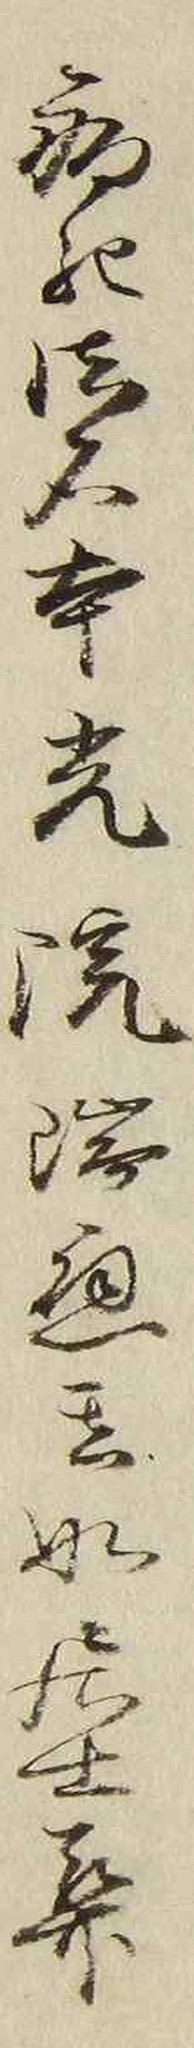病死法名本光院瑞応甚如居士葬

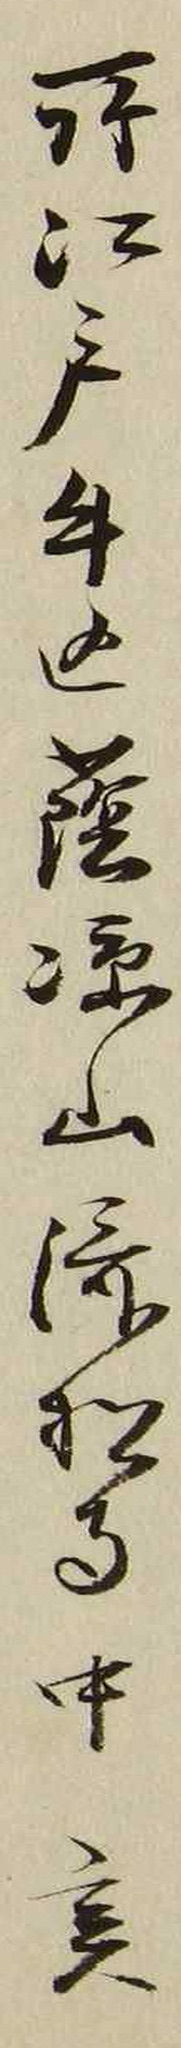所江戸牛込蔭涼山済松寺中実
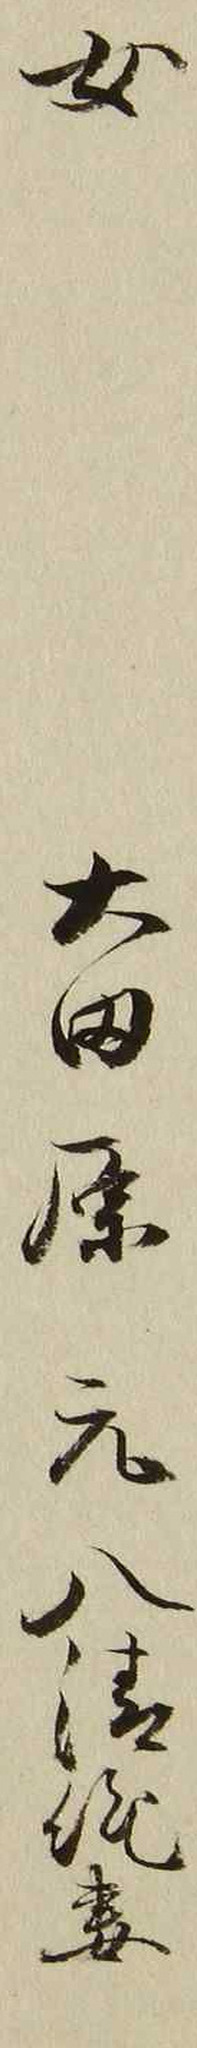女大田原元八清純妻
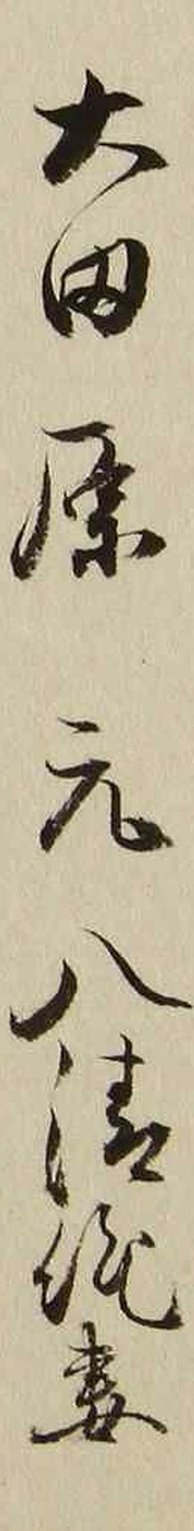女大田原元八清純妻
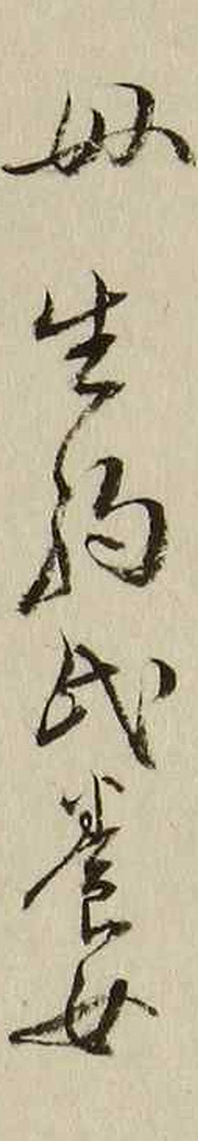母生駒氏養女
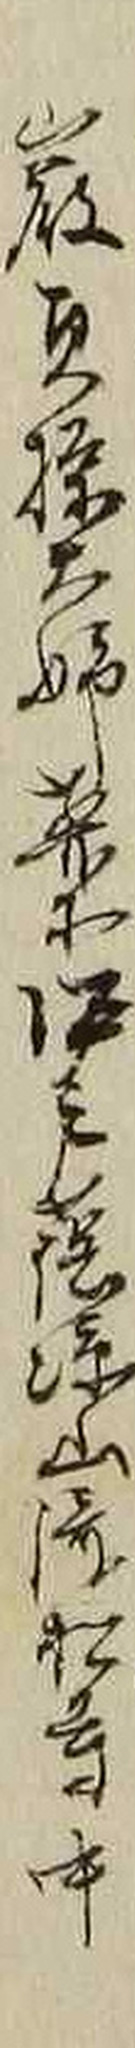厳貞操大姉葬所江戸蔭涼山済松寺中
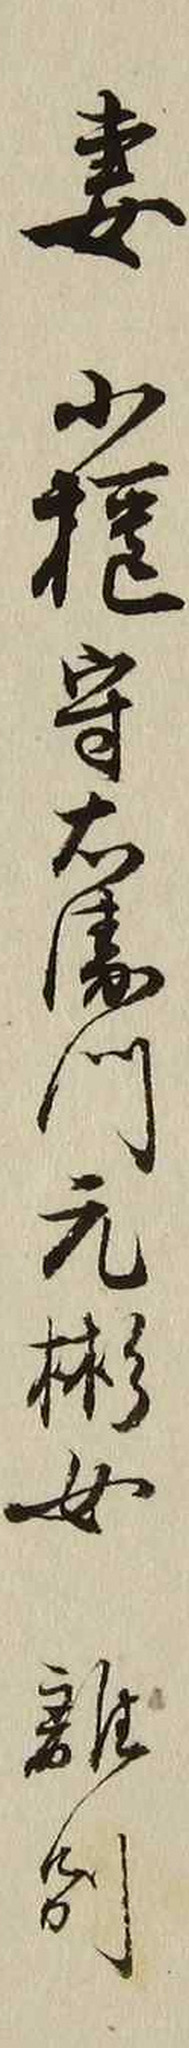妻小櫃守右衛門元彬女離別
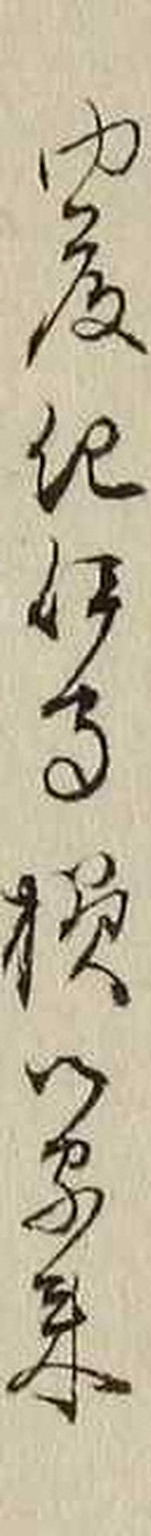内藤紀伊守様御家来
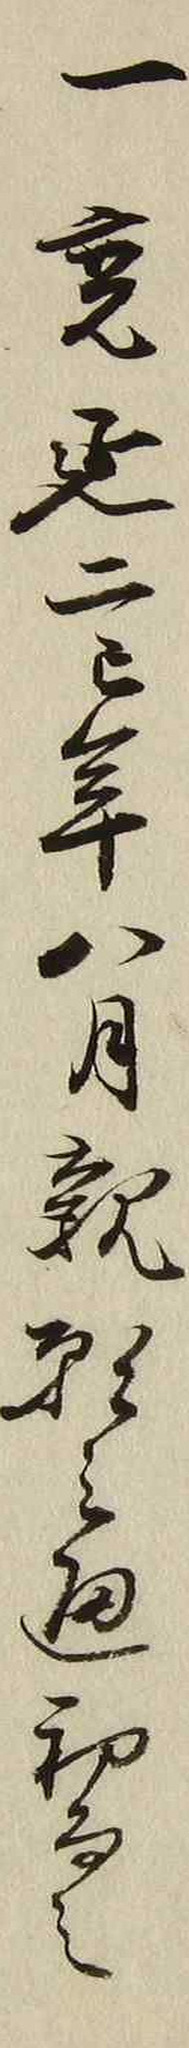一寛延二巳年八月親願之通初而之
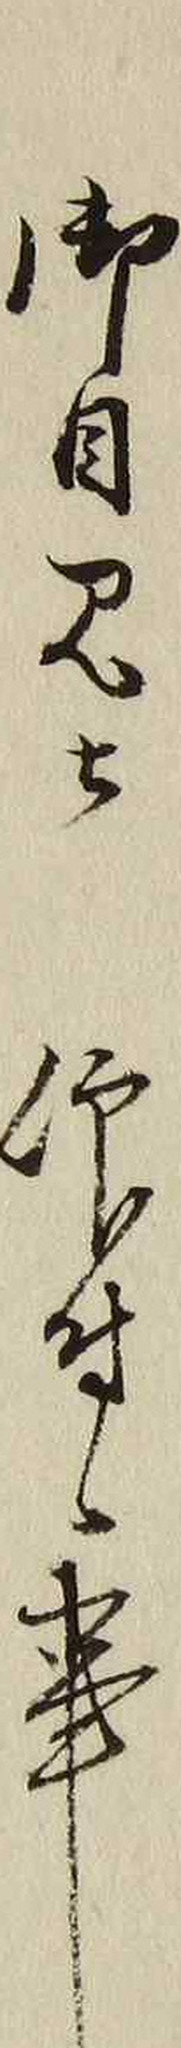御目見被仰付候事
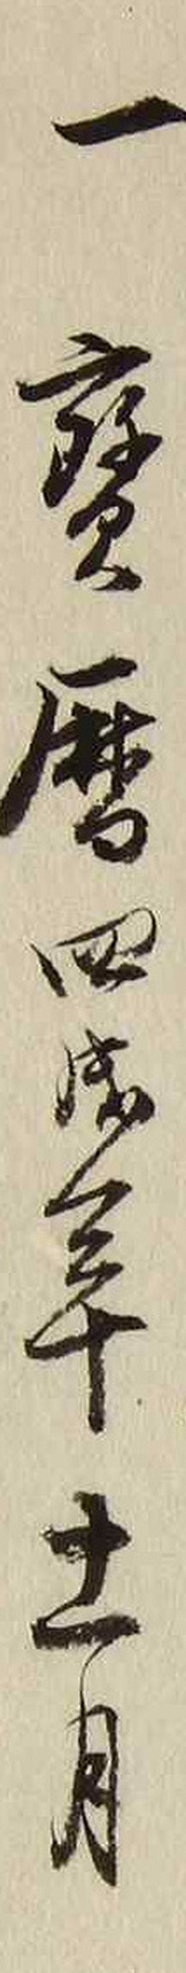一宝暦四戌年十一月
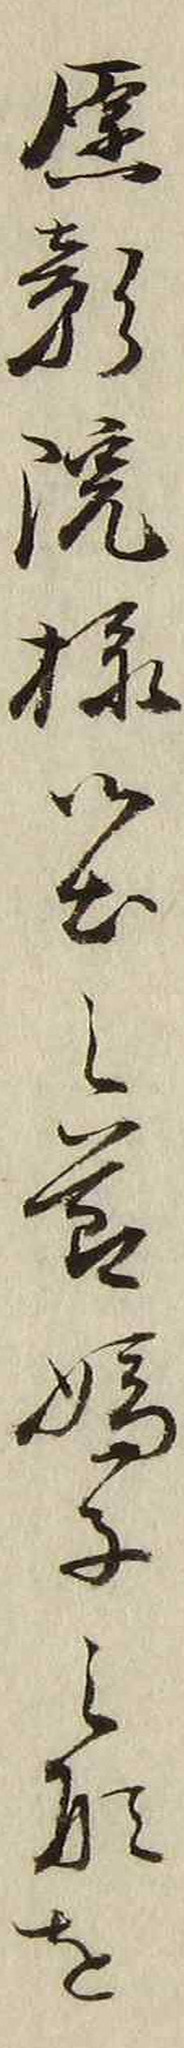愿顔院様御出之節嫡子之形を
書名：諸士系譜　巻之292　き之部1
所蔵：会津若松市立会津図書館
